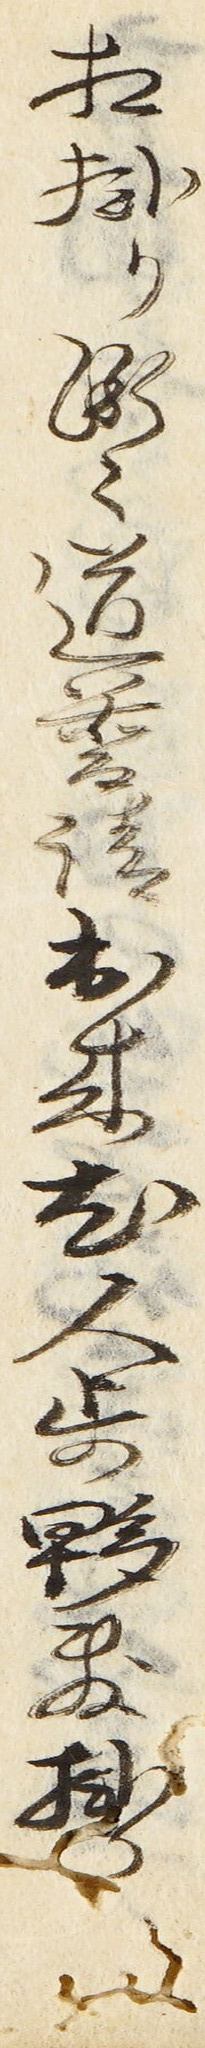相掛り漸々道普請出来尤人歩夥敷掛り
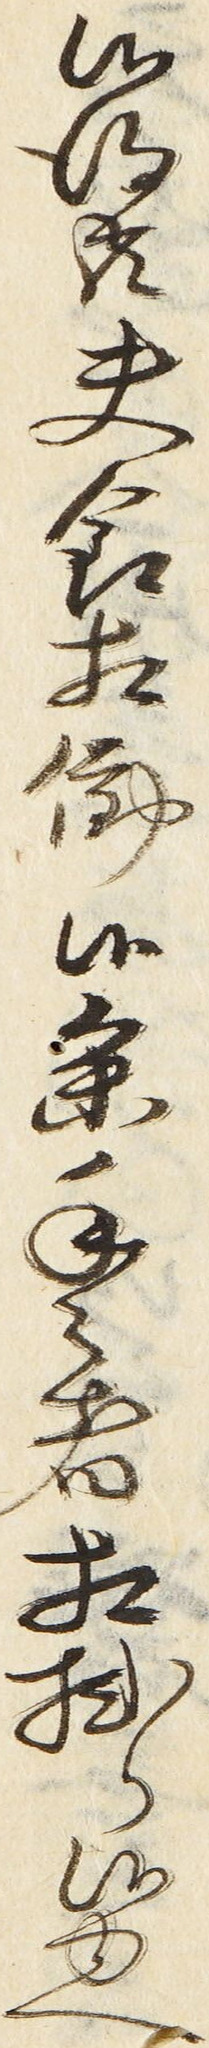候得共夫食相働候参年ニ者相掛り候ゆへ
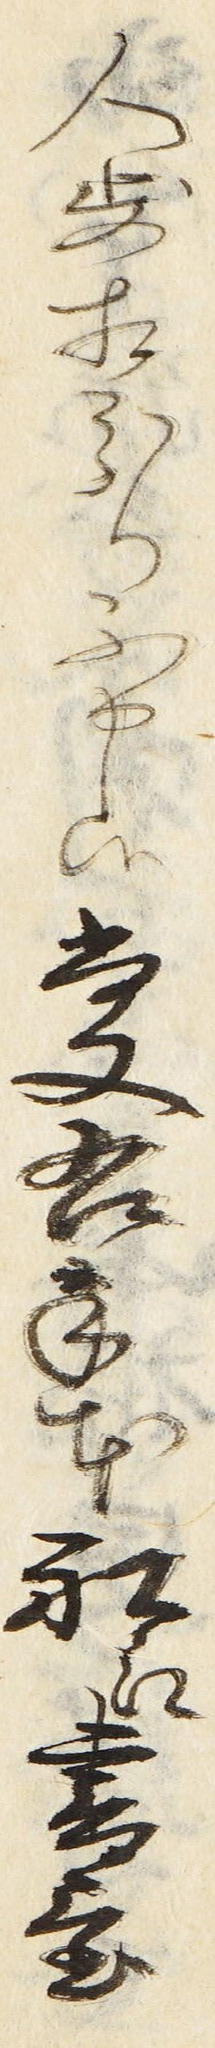人歩相分り不申候尚又右手本船江書置
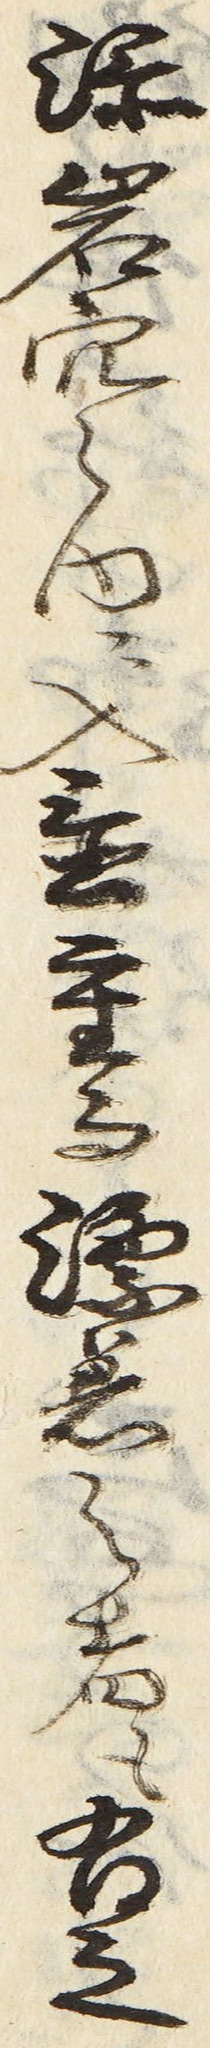添岩穴之内ニ入置重而漂着之者も有之
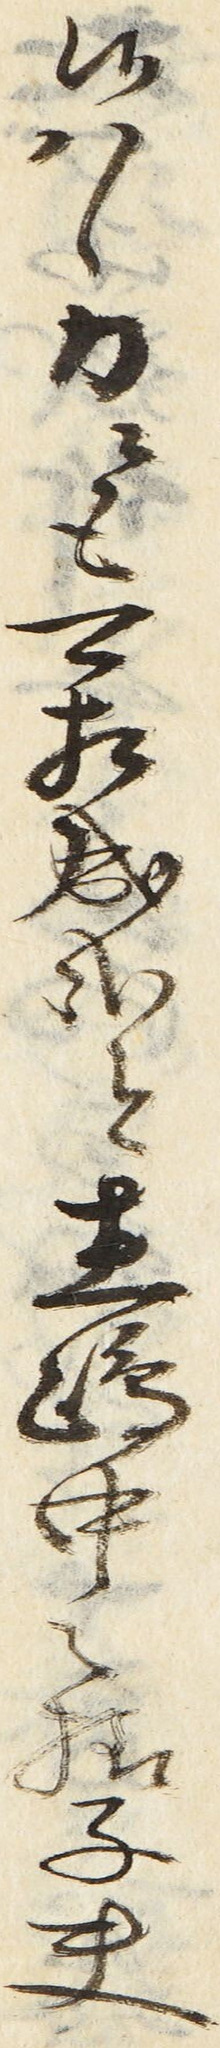候ハヽ力ニも可相成哉と在嶋中之様子夫
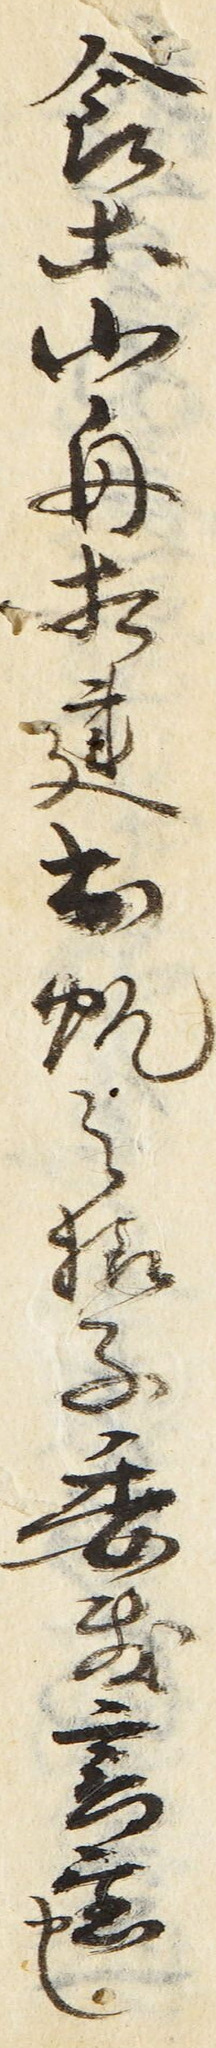食等小舟相建出帆之様子委敷書置申候
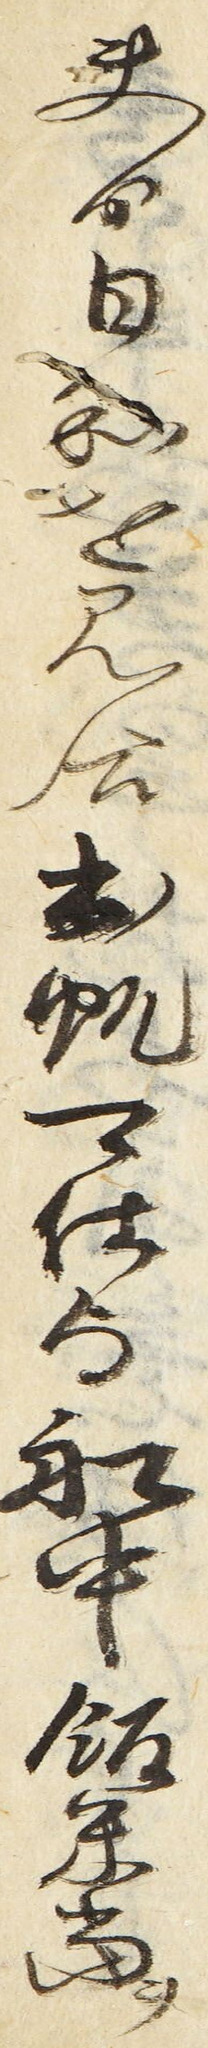夫ゟ日和を見合出帆可仕与船中飯米当ヲ

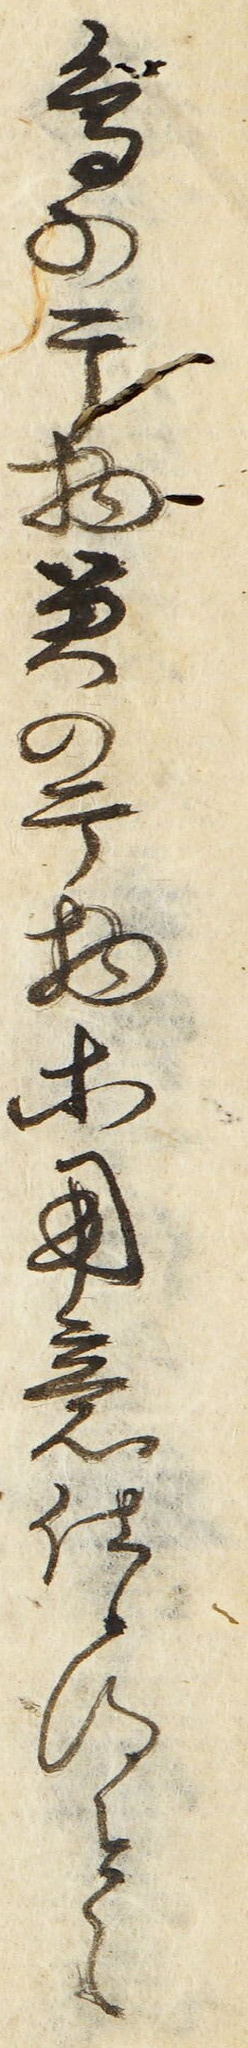鳥の干物魚の干物等用意仕候得とも
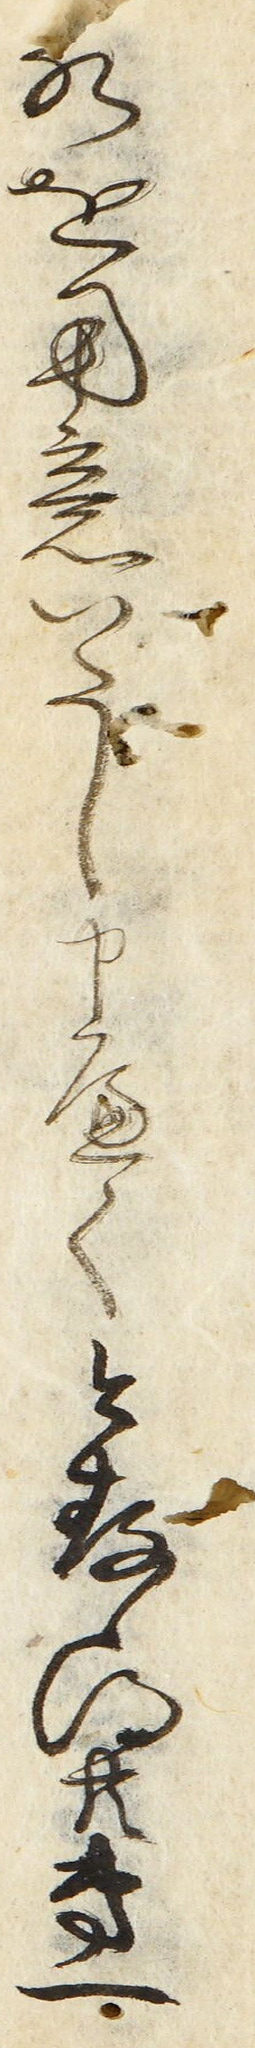水を用意いたし申へくと存候得共第一
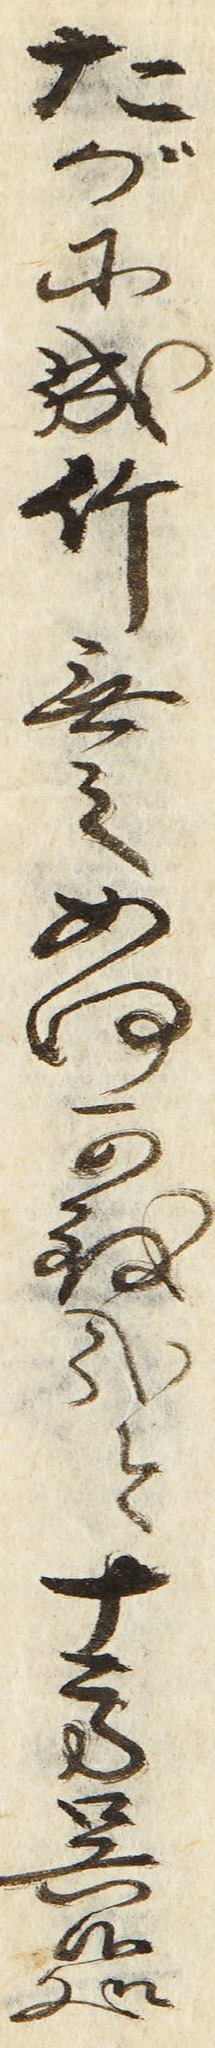たがに成竹無之如何可致哉と十方呉候処
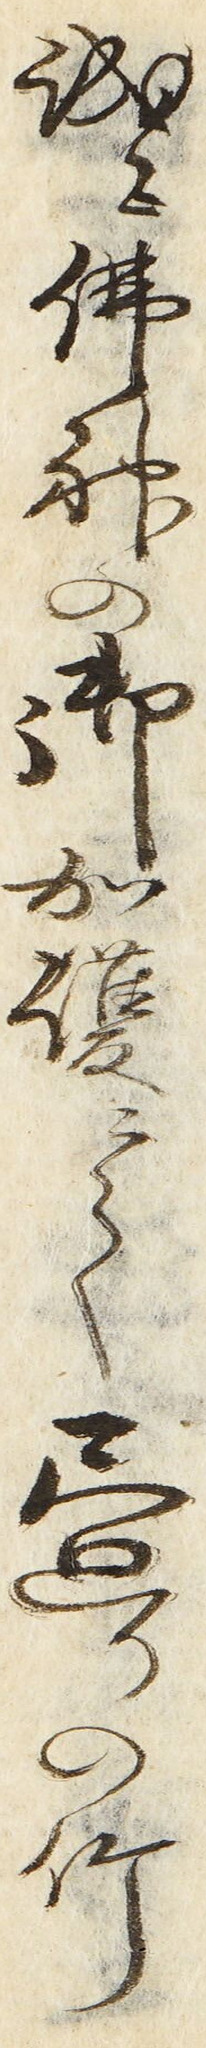誠ニ仏神の御加護ニて尺廻りの竹
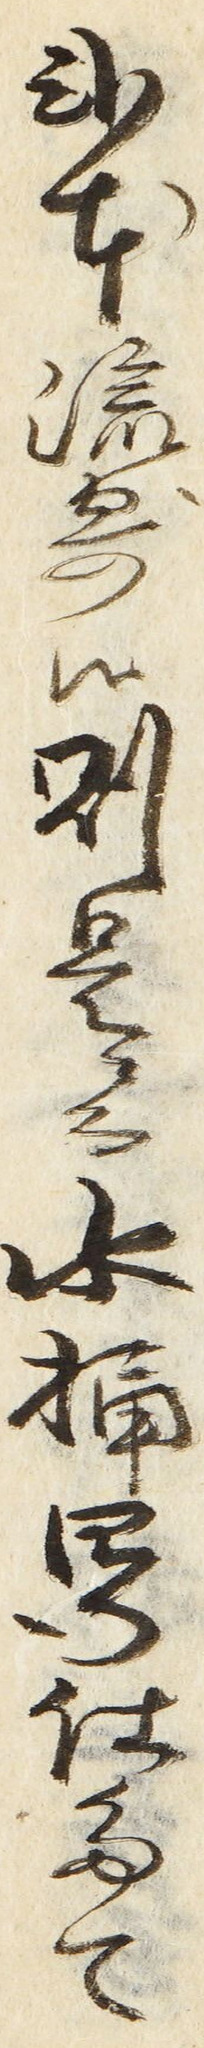弐本流寄候則是ニ而水桶四ツ仕たて
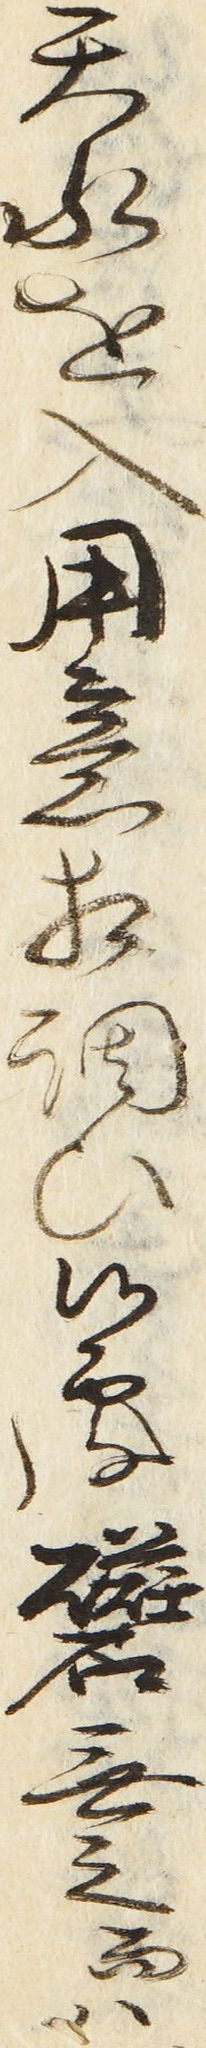天水を入用意相調ひ候処磁石無之而ハ
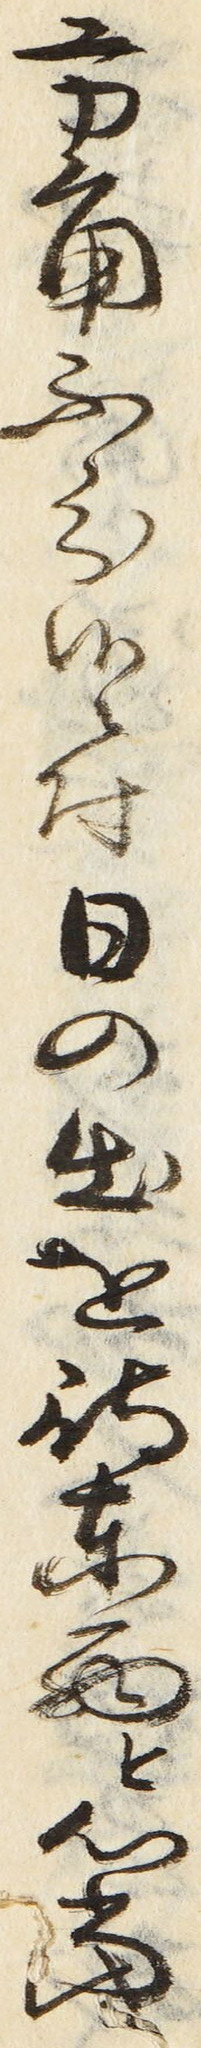方角不分候ニ付日の出を待東西と心当
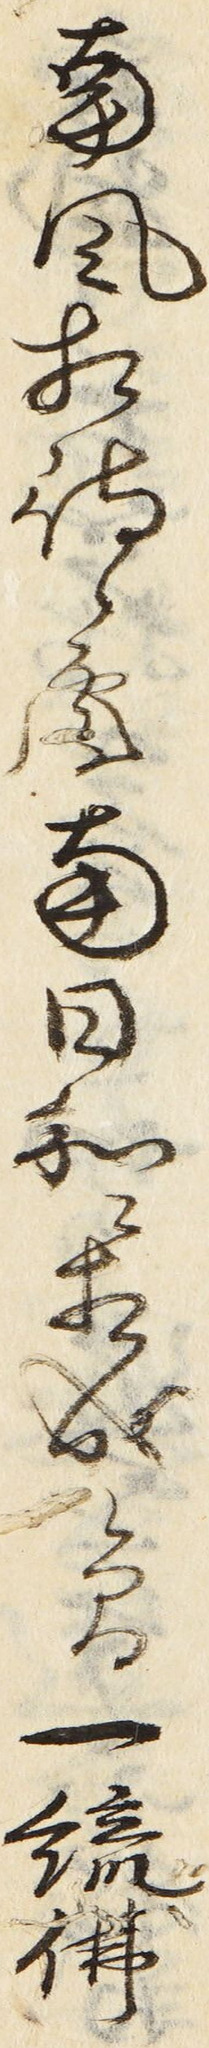南風相待候処南日和ニ相成候間一統仏
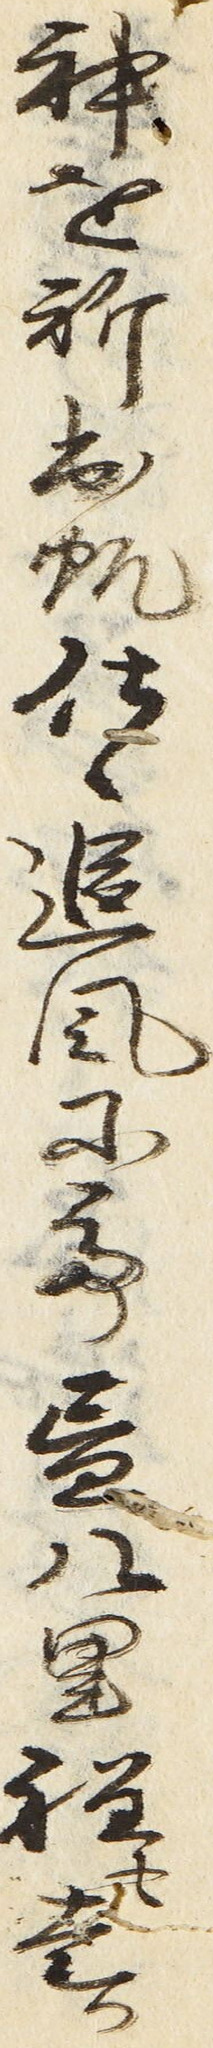神を祈出帆仕候追風にて昼八里程も走り
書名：漂流一件上書
